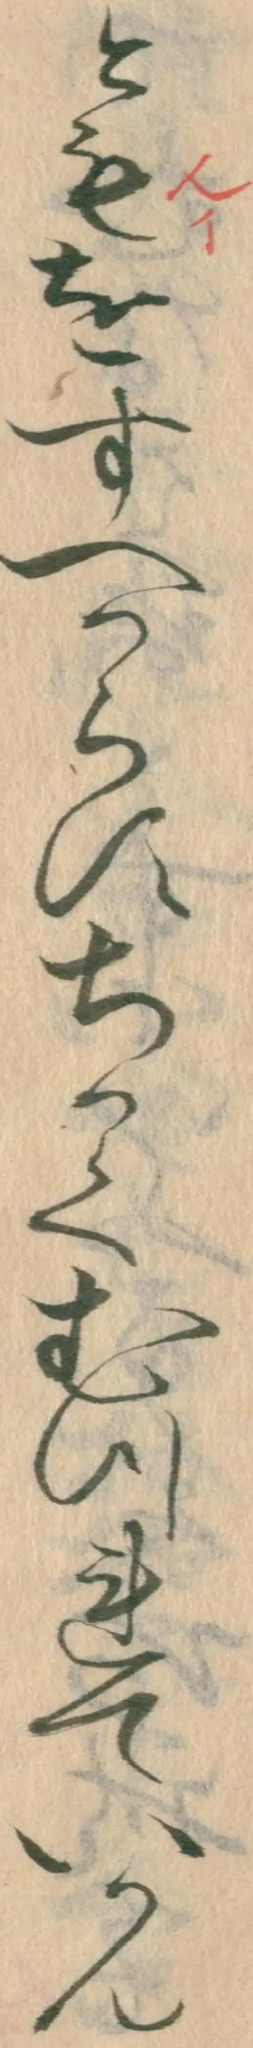ともをすへからすちかくむつれていかん
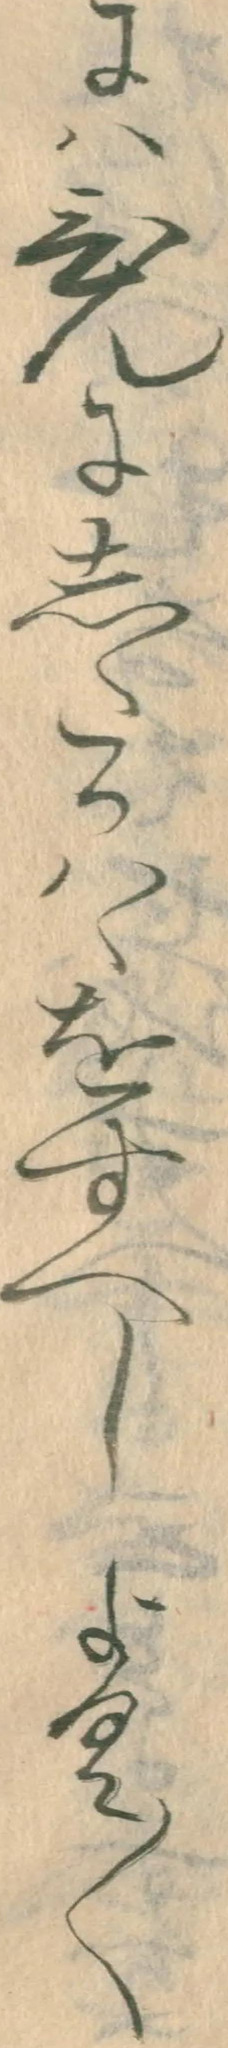にはひんにしたかはゝをすへしよく〳〵
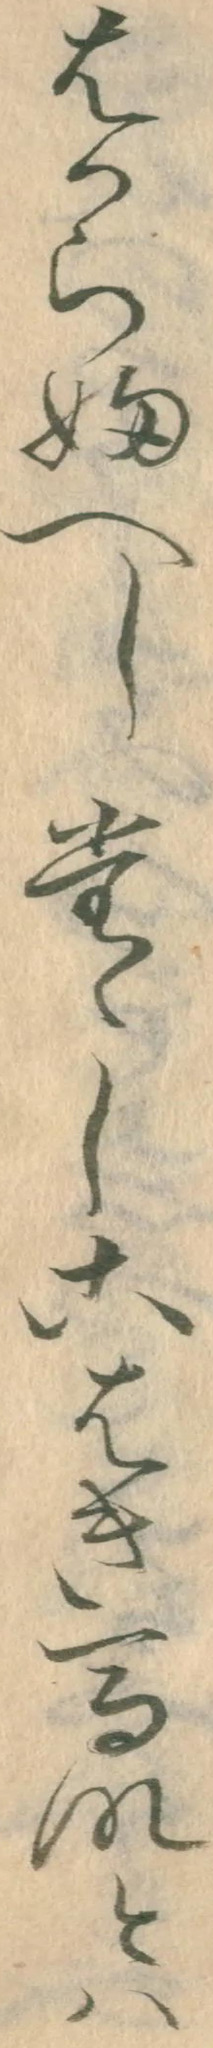はからふへしたゝしこはき馬なとは
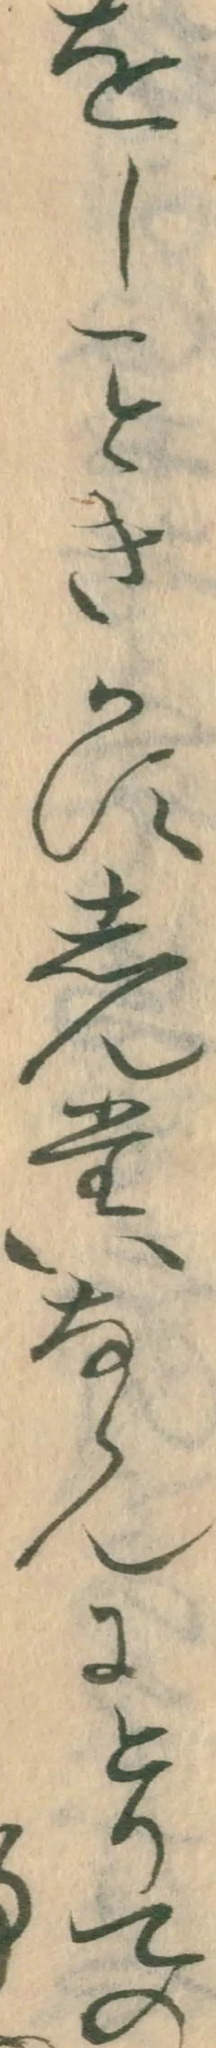をしこときかすしんたいならんにとりての

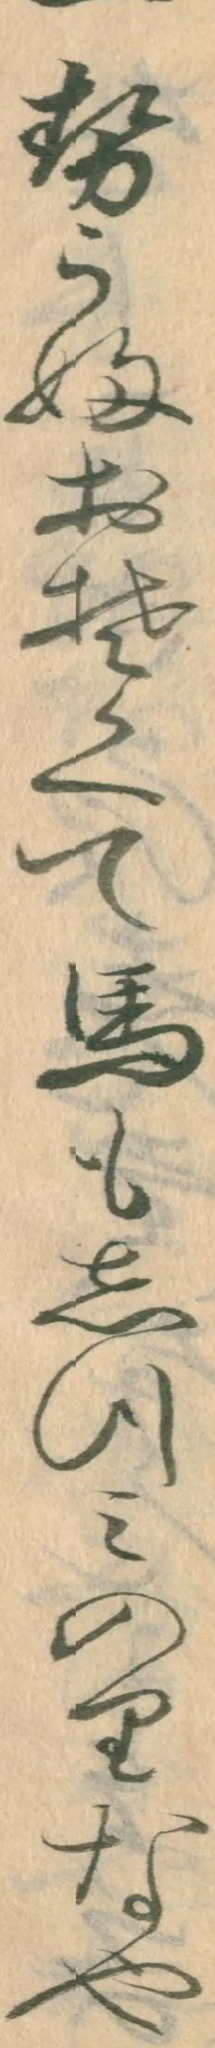一せらふおそくて馬もしつみのりなや
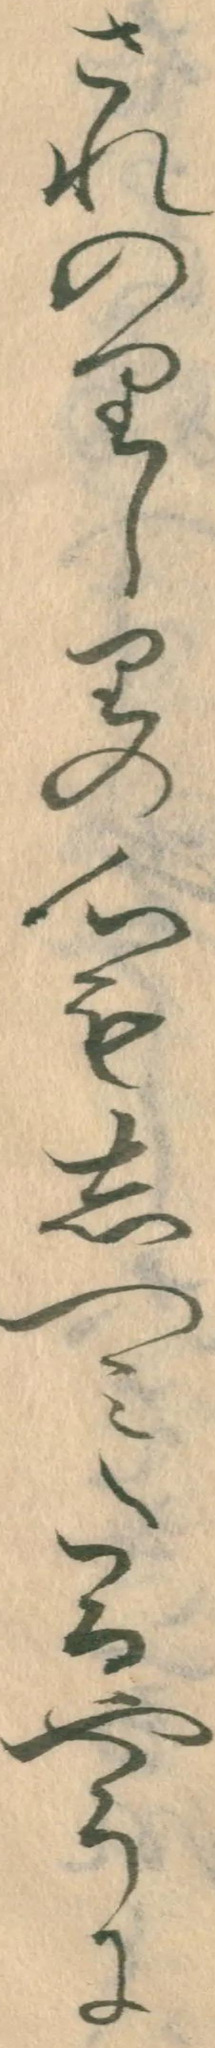されのりしりの心もしつみたるやうに
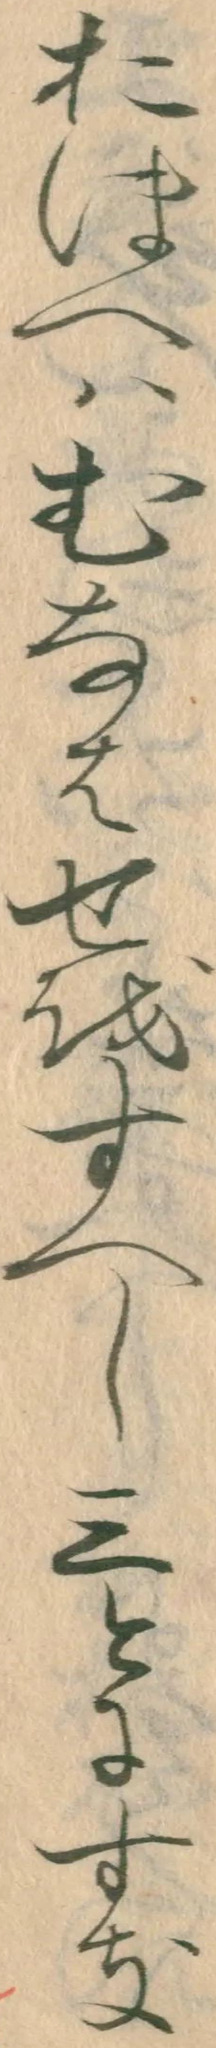おほへはむなはせをすへし三とにすき
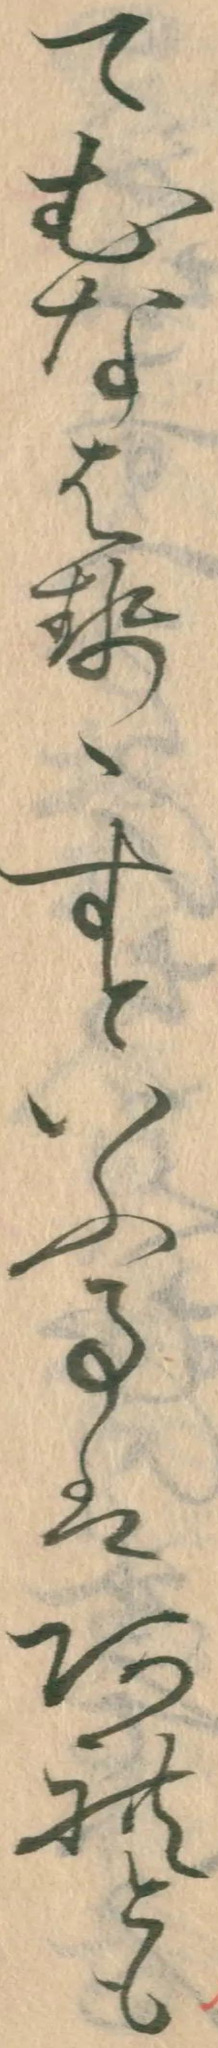てむなはせゝすといふ事はあれとも
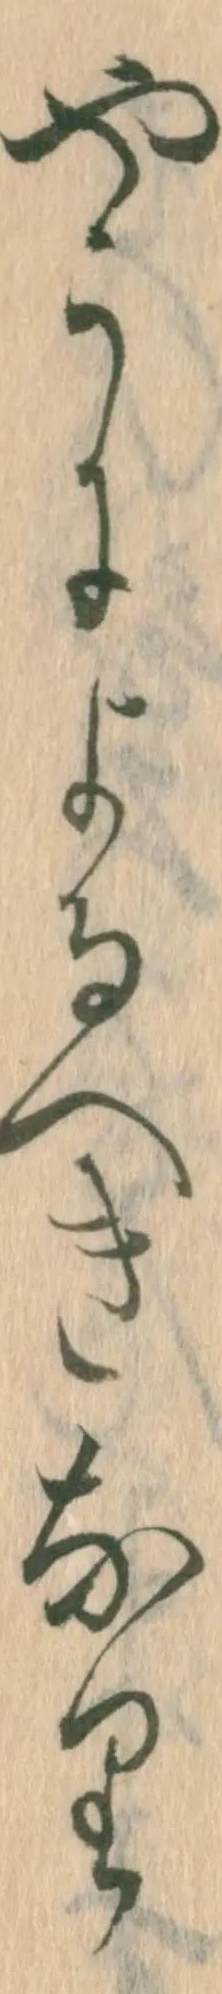やうによるへきなり
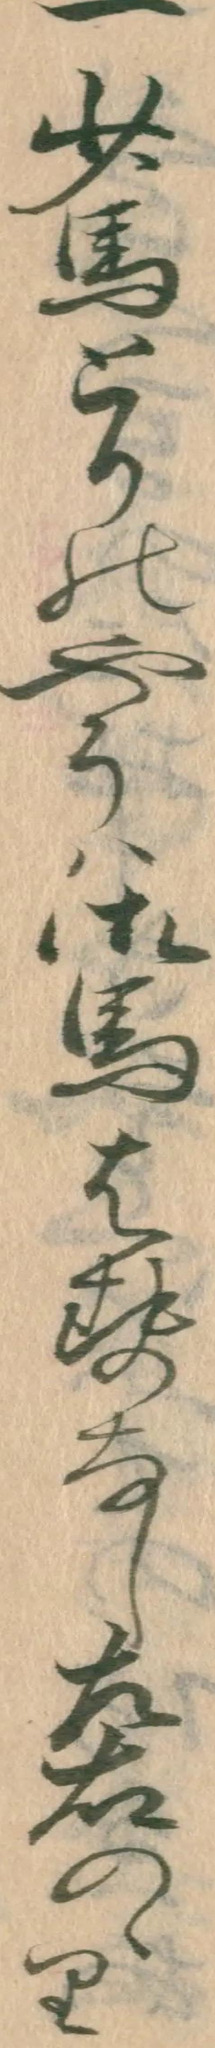一少馬とりのやうは御馬はせなし左右のゝり
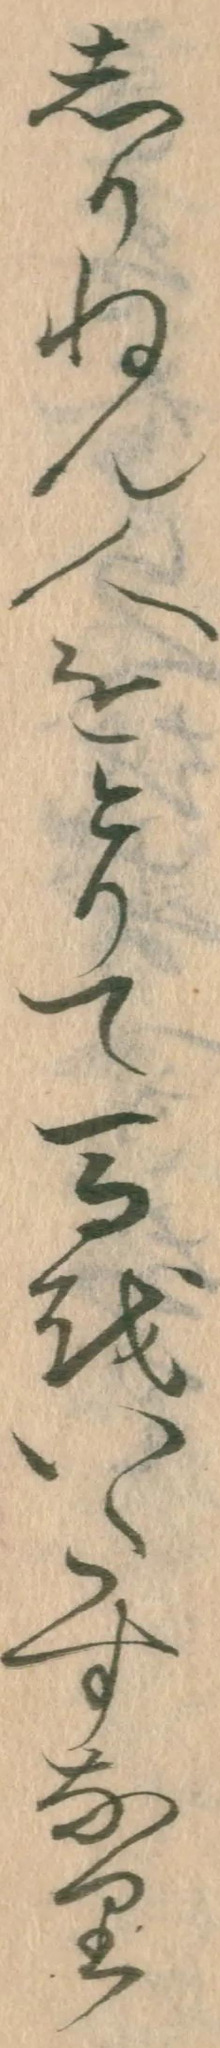しりねん人をとりて馬をいたすなり
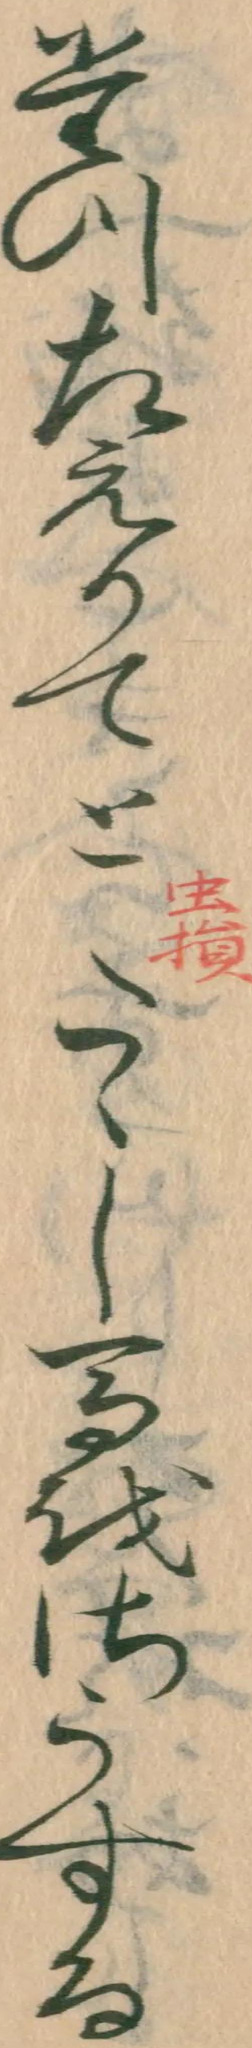たつ左えりてとたゝし馬をさうする
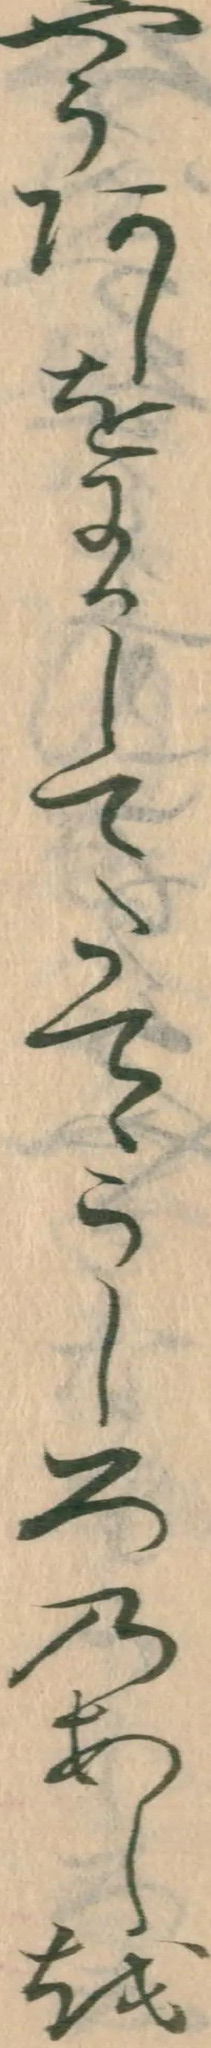やうあしをにかしてたてゝうしろのあしを
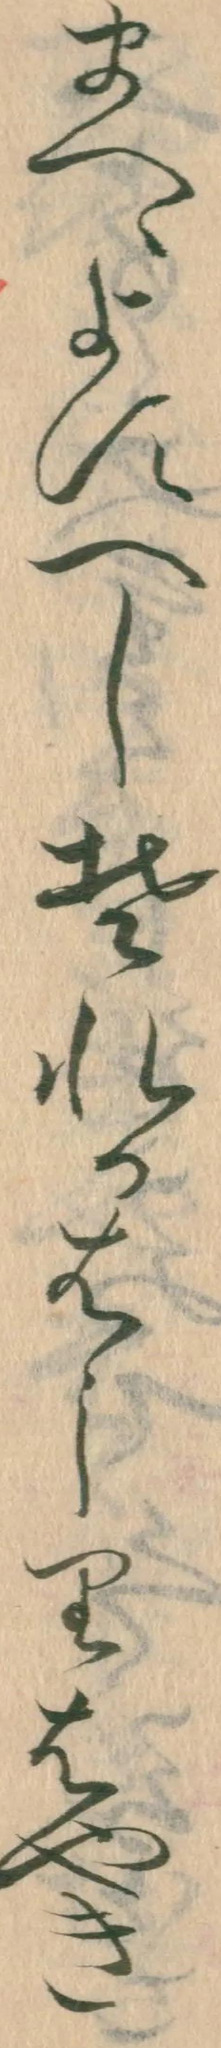まへゝよすへしそれかはしりはやき
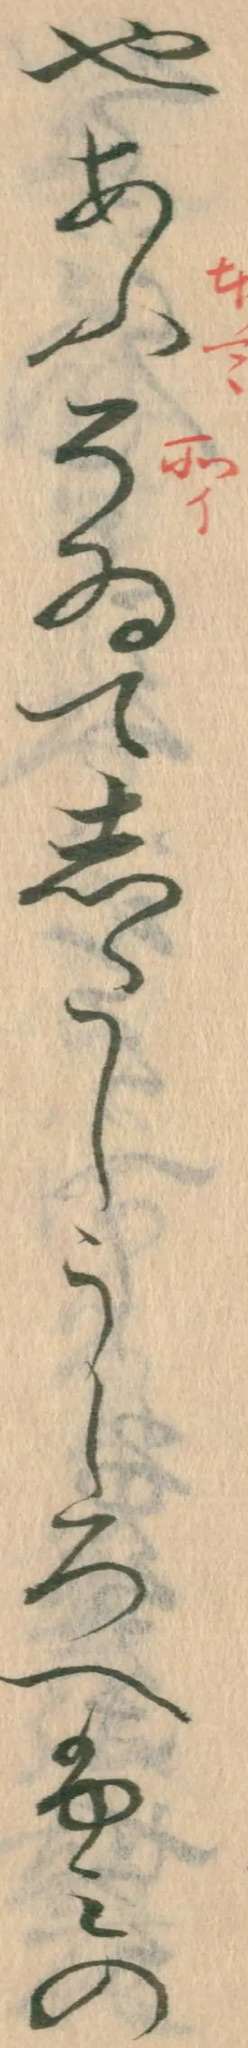也あふそゐてしたしうしろへふみの
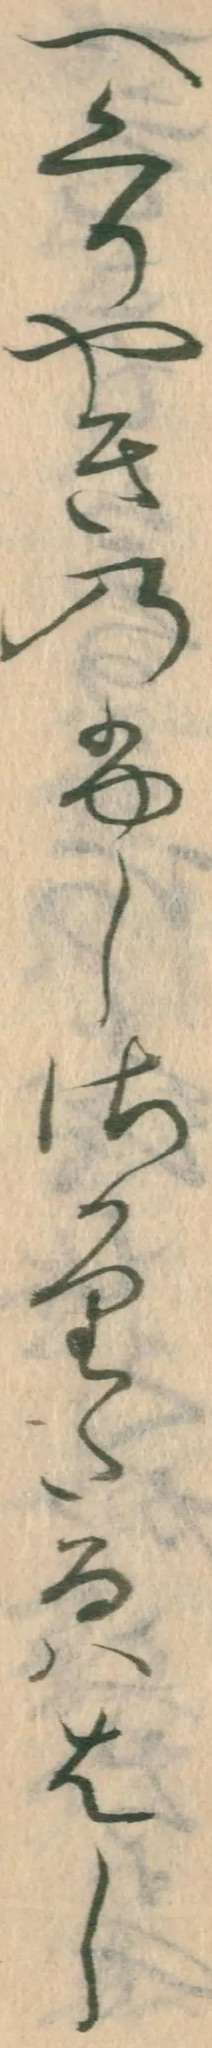へくりやきのふしさかりたるははし
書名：賀茂社記録. 第13冊
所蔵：国立国会図書館 National Diet Library, JAPAN
